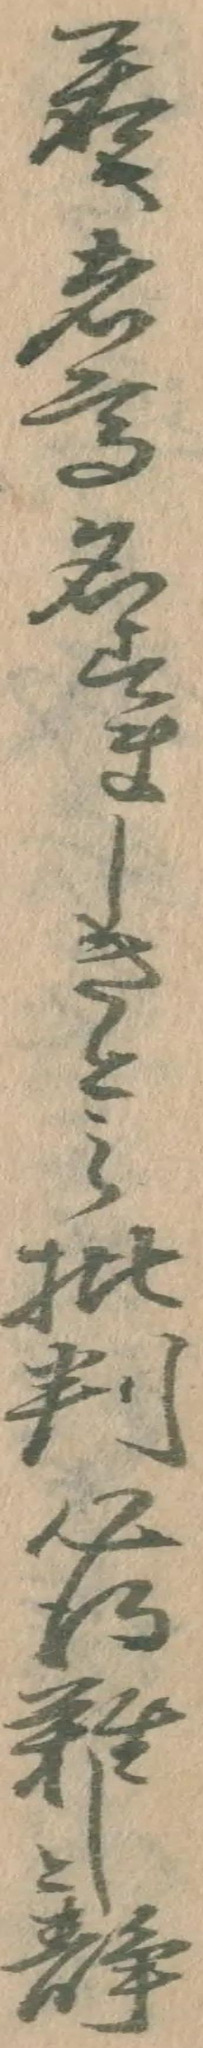若き者高名春ましきと之批判心得難しと静
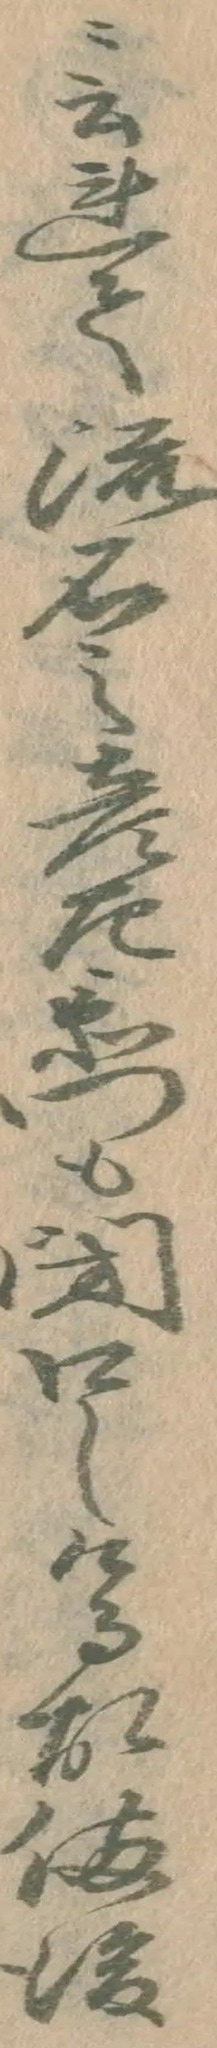に云連て流石之彦左衛門も閉口しける故備後
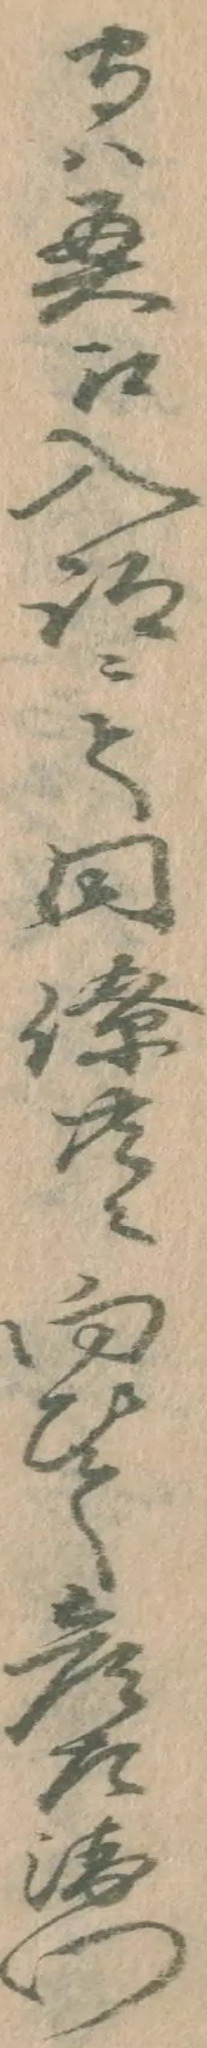守は奥江入跡にて同僚共に向ひて彦左衛門
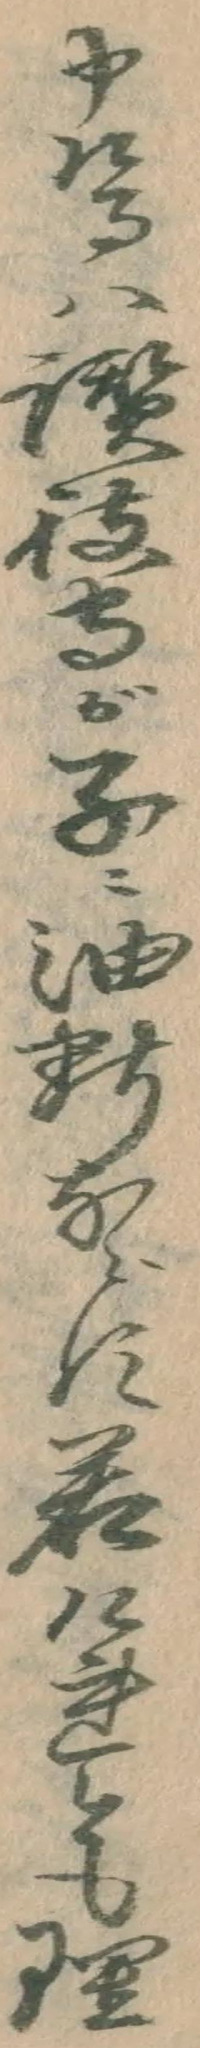申けるは讃岐守が子に油断なら須若け連とも理
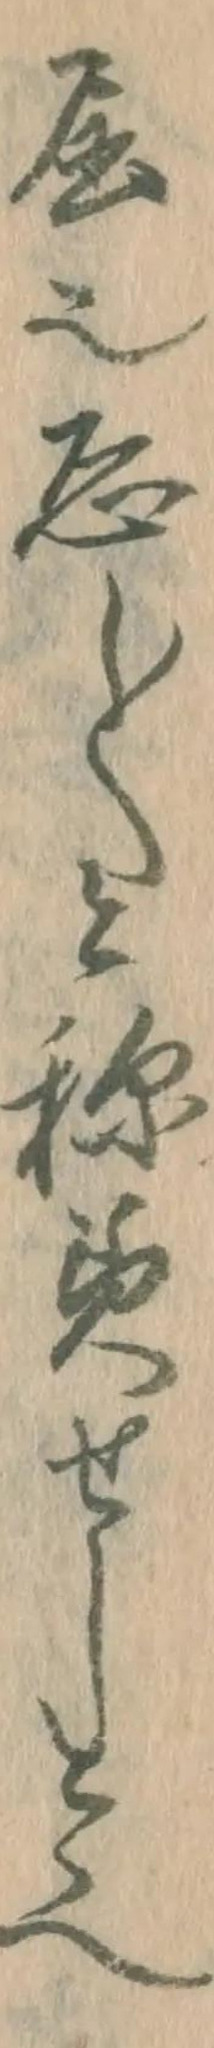屈也恐し〳〵と称美せしと也
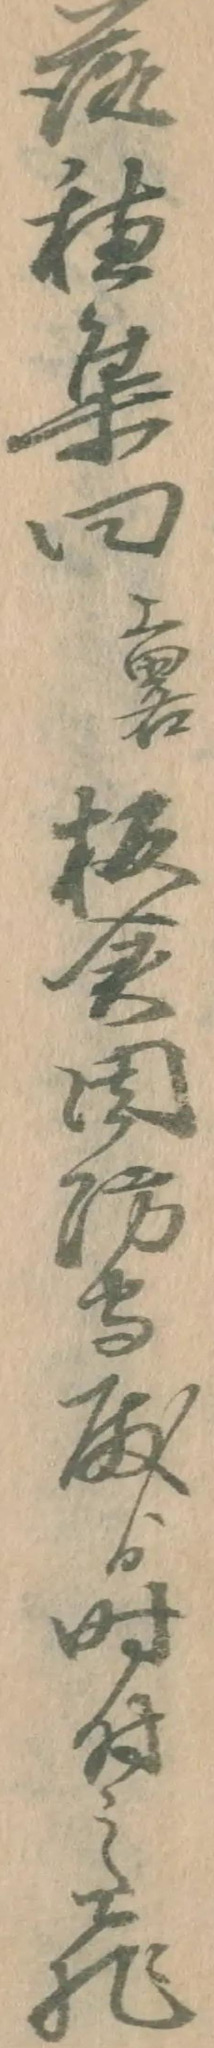落穂集曰上略板倉周防守殿ゟ時付之飛

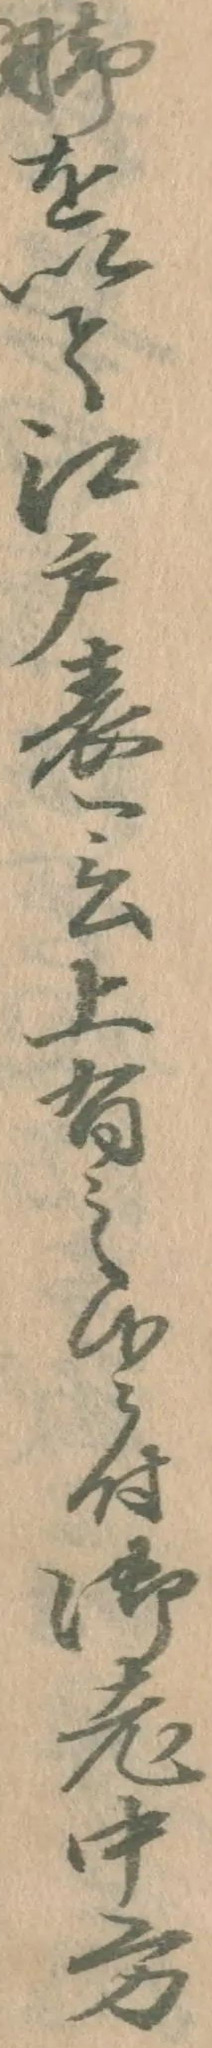脚を以て江戸表へ云上有之候に付御老中方
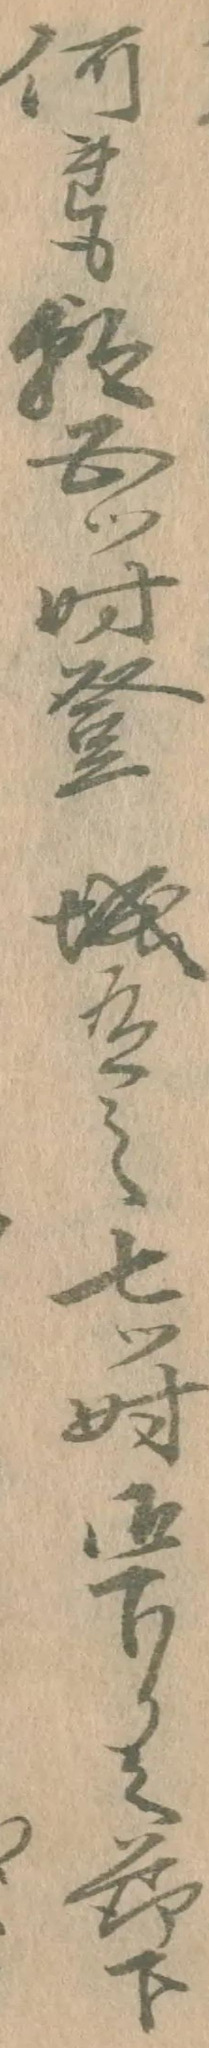何連も朝五つ時登城有之七つ時御下りて節下
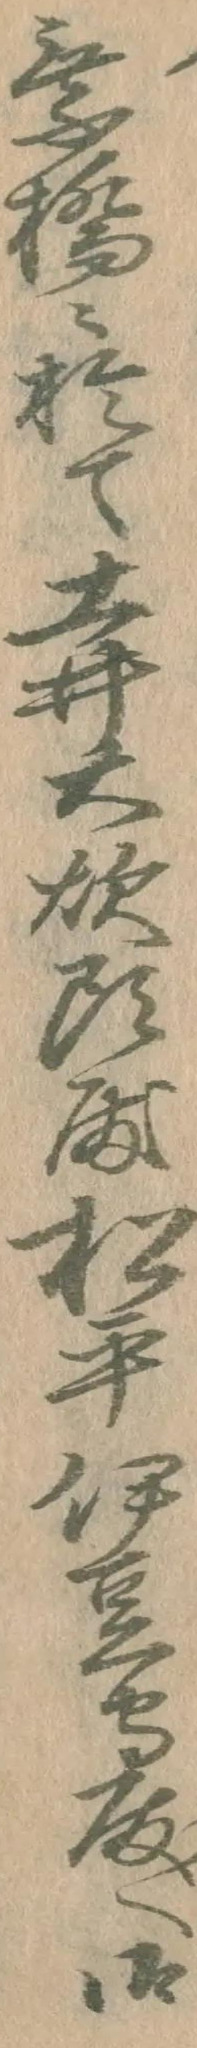乗橋に於て土井大炊頭殿松平伊豆守殿へ御
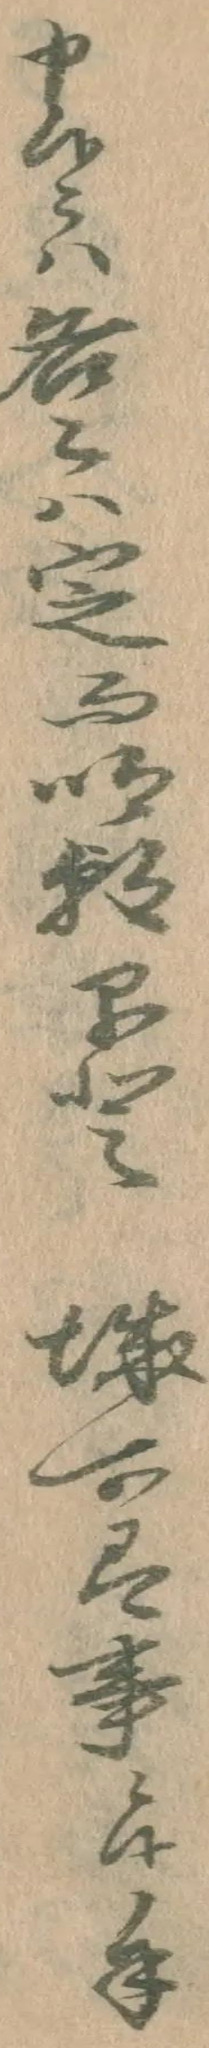申候には各らは定而明朝早登城可尽事に候手
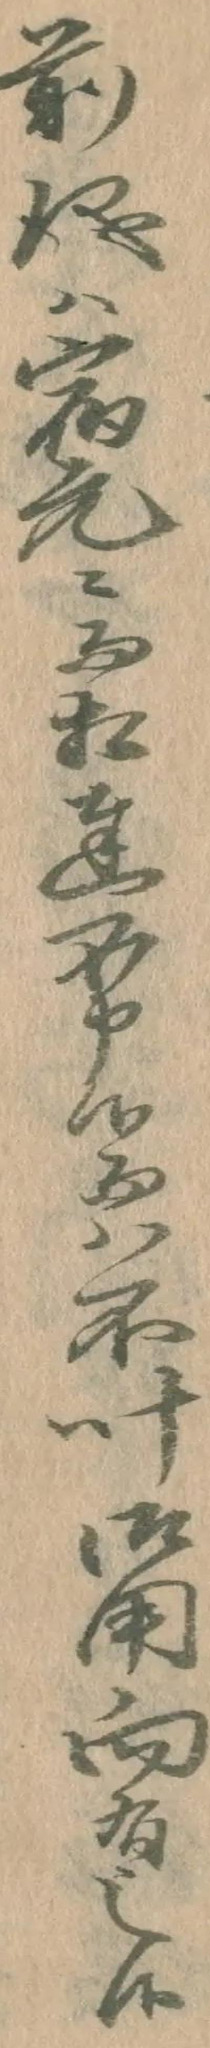前儀は宿元に而相達不申候而は不叶御用向有之候
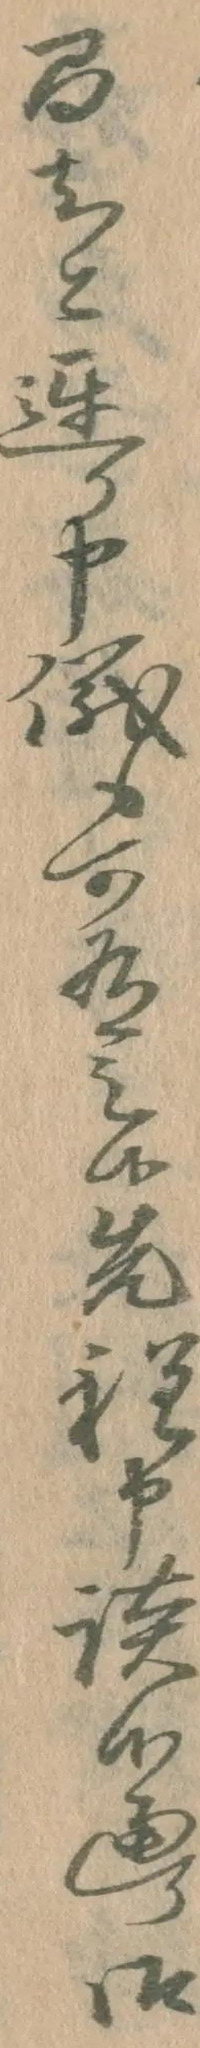間ちと遅り申儀も可有之候先程申談候通り御
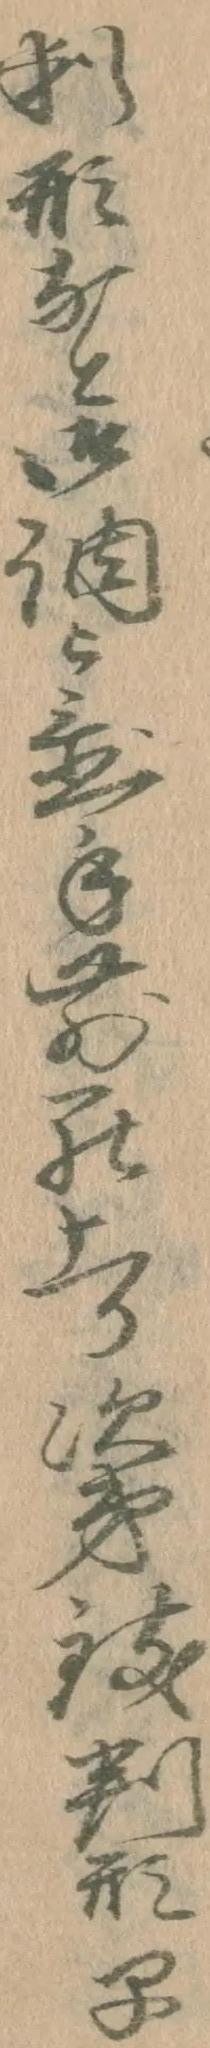判形なと御調被置手前罷上り次第致判形早
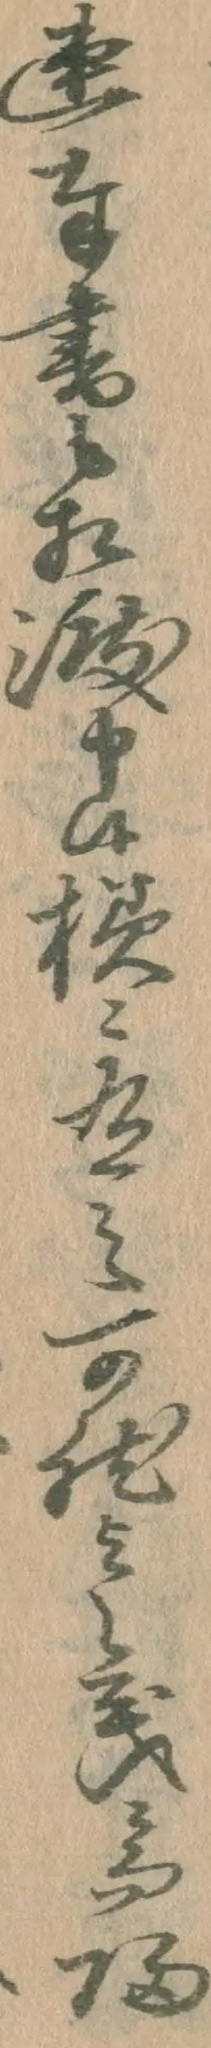速奉書も相渡申候様に有之可然与之義に而帰
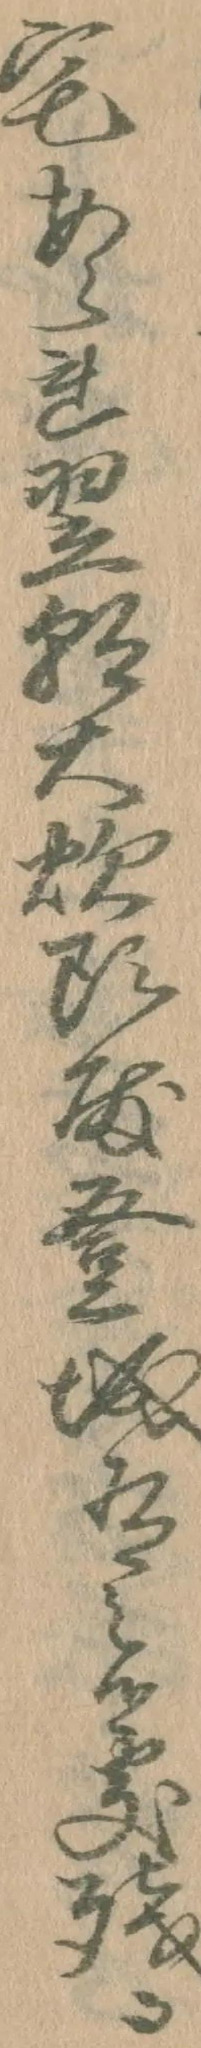宅あら連翌朝大炊頭殿登城有之候處残る
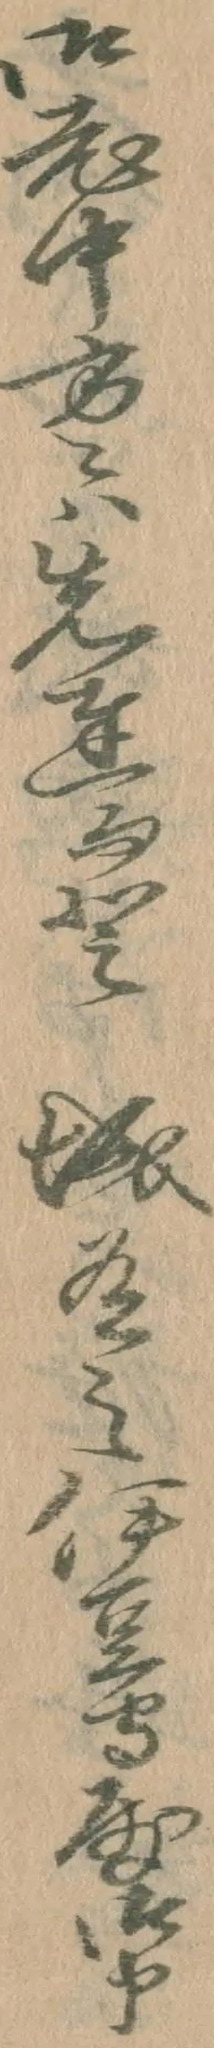御老中方には先達而登城有之伊豆守殿御申
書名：切支丹御退治記 49巻. [2]
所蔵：国立国会図書館 National Diet Library, JAPAN
